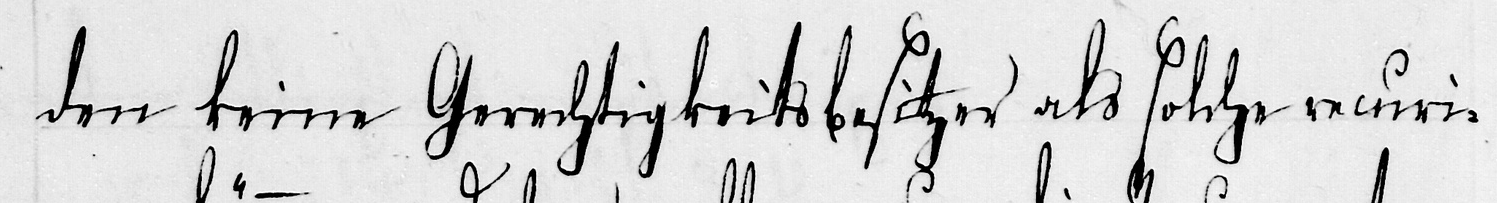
den keine Gerechtigkeitsbesitzer als solche recuri¬
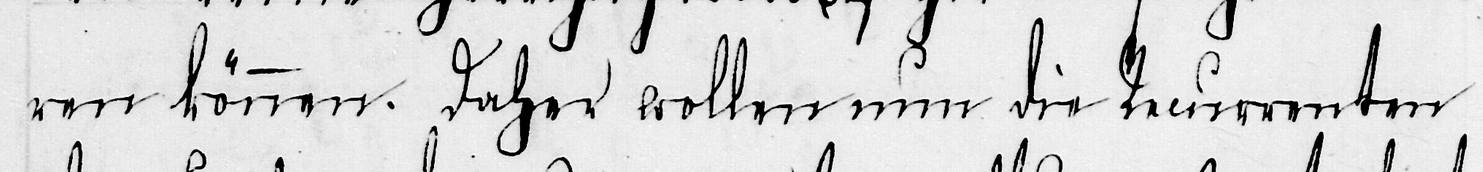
ren können. Daher wollen nun die Recurrenten
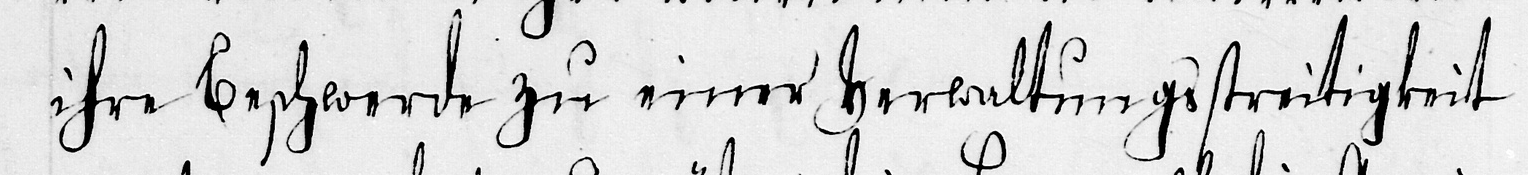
ihre Beschwerde zu einer Verwaltungsstreitigkeit
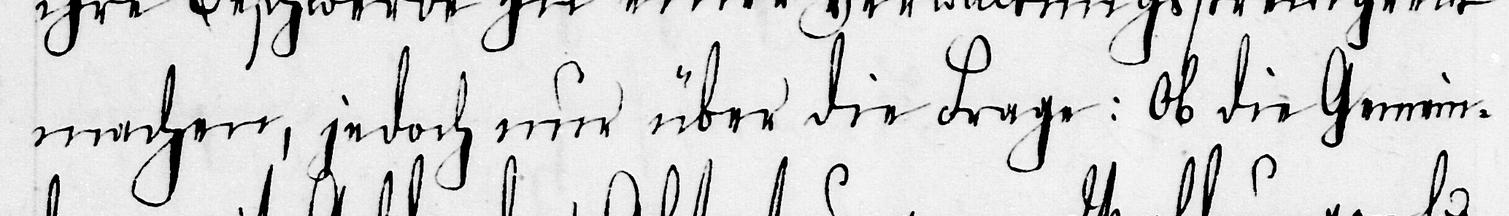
machen, jedoch nur über die Frage: Ob die Gemein¬
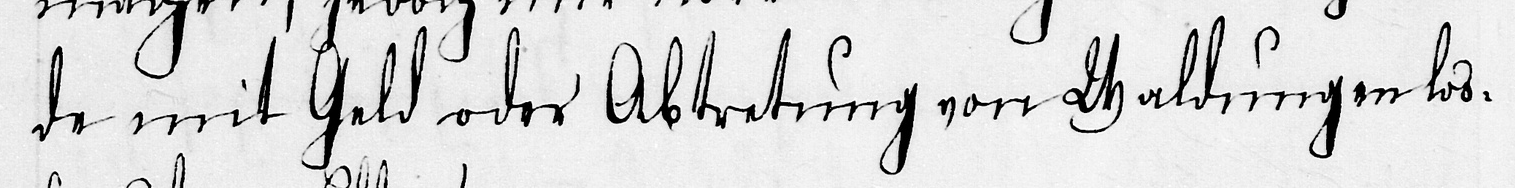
de mit Geld oder Abtretung von Waldungen los¬
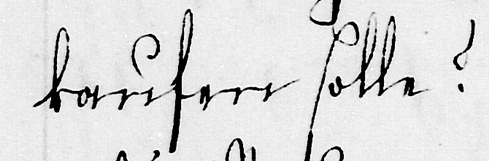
kaufen solle?
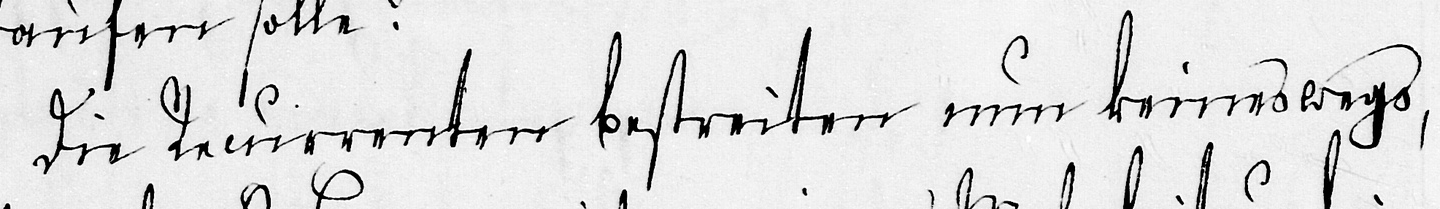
Die Recurrenten bestreiten nun keineswegs,
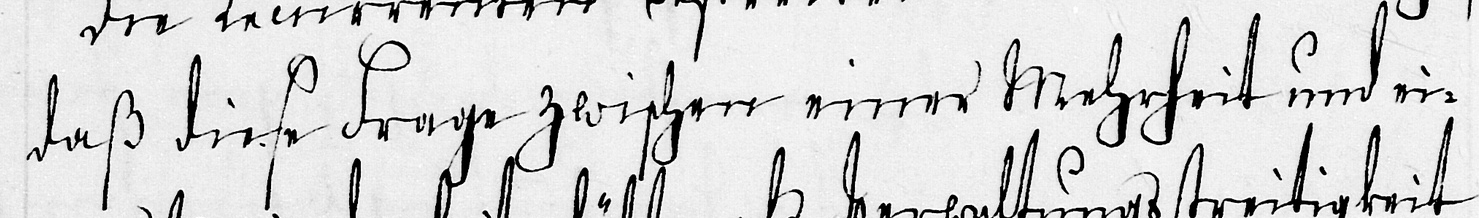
daß diese Frage zwischen einer Mehrheit und ei¬
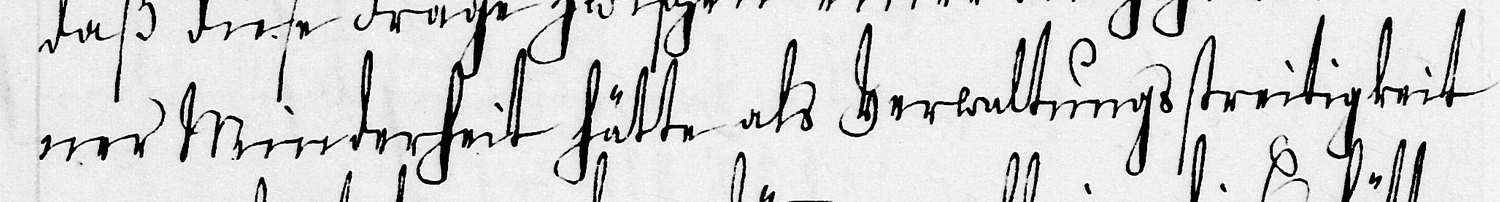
ner Minderheit hätte als Verwaltungsstreitigkeit
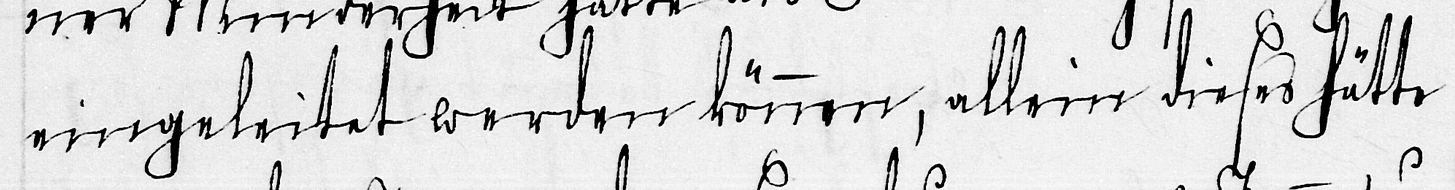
eingeleitet werden können, allein dieses hätte
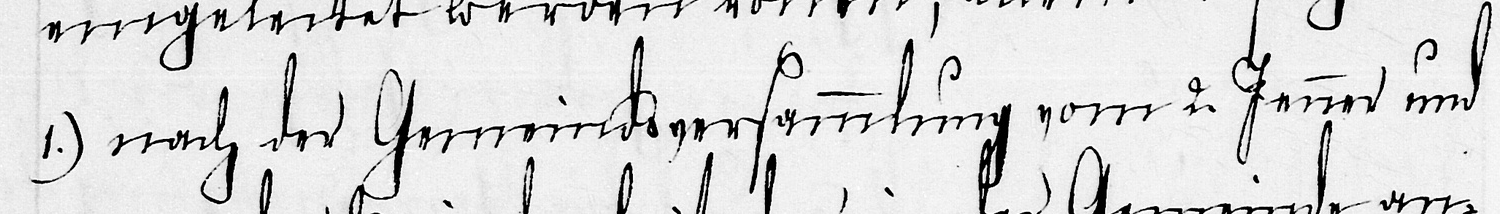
1.) nach der Gemeindsversammlung vom 2. Jenner und
